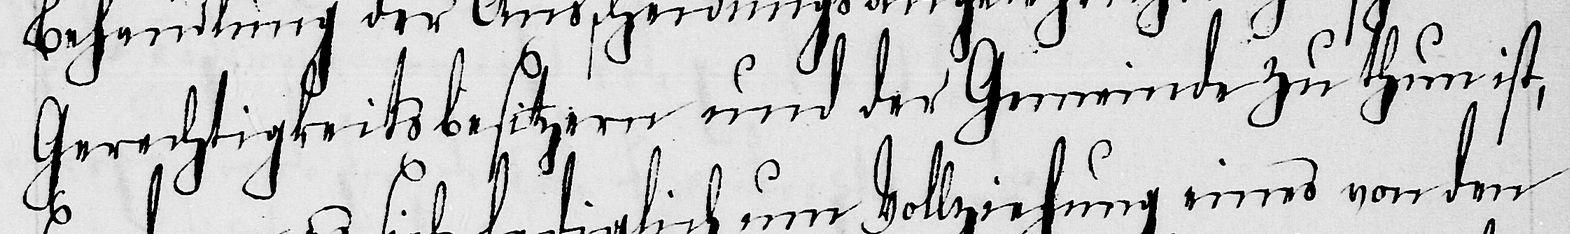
Gerechtigkeitsbesitzern und der Gemeinde zu thun ist,
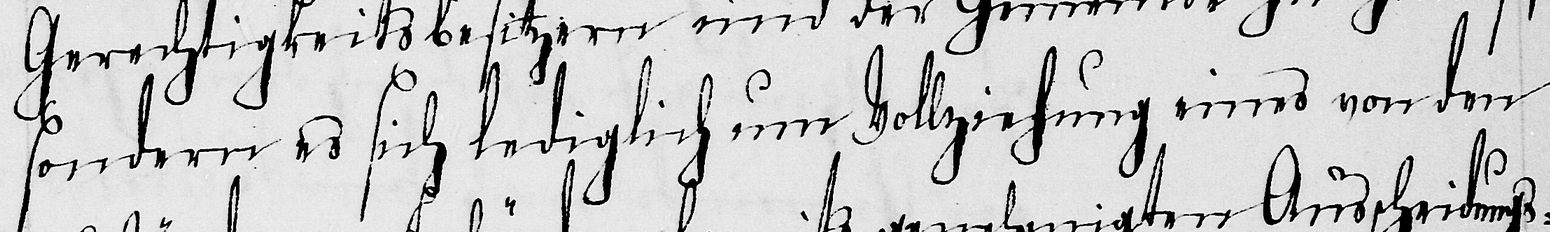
sondern es sich lediglich um Vollziehung eines von dem
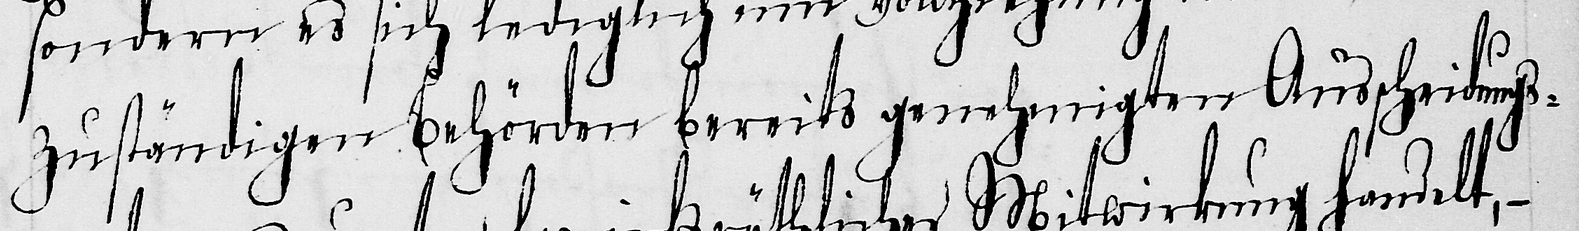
zuständigen Behörden bereits genehmigten Ausscheidungs¬
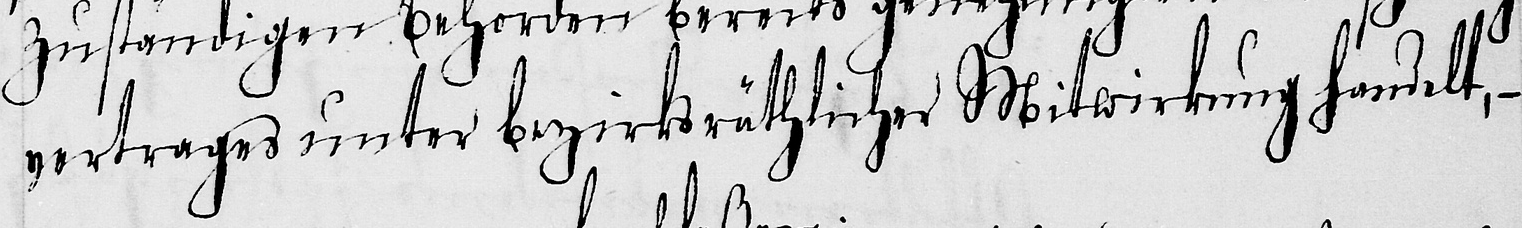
vertrages unter bezirksräthlicher Mitwirkung handelt,
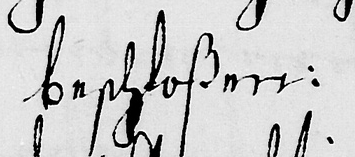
beschloßen:
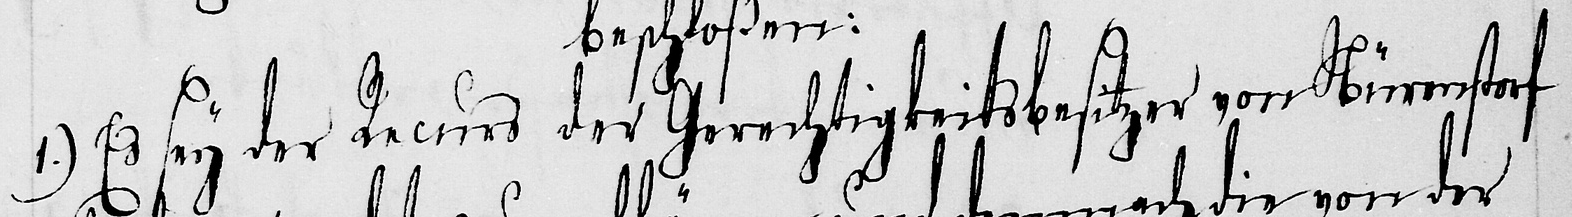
Es sey der Recurs der Gerechtigkeitsbesitzer von Nürenstorf
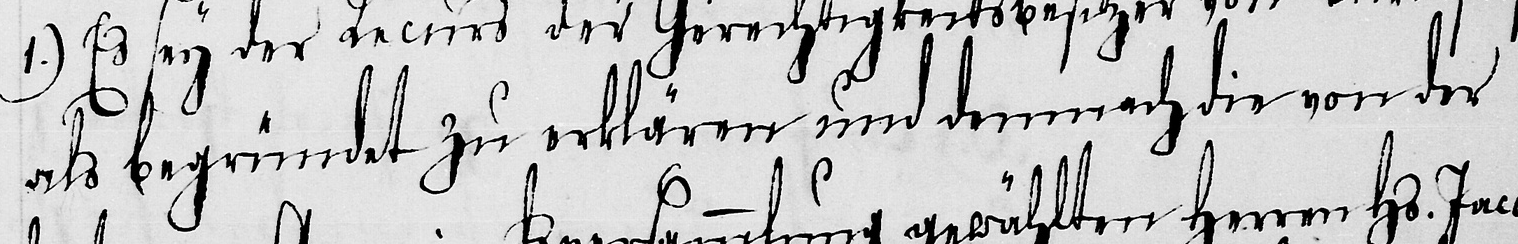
als begründet zu erklären und demnach die von der
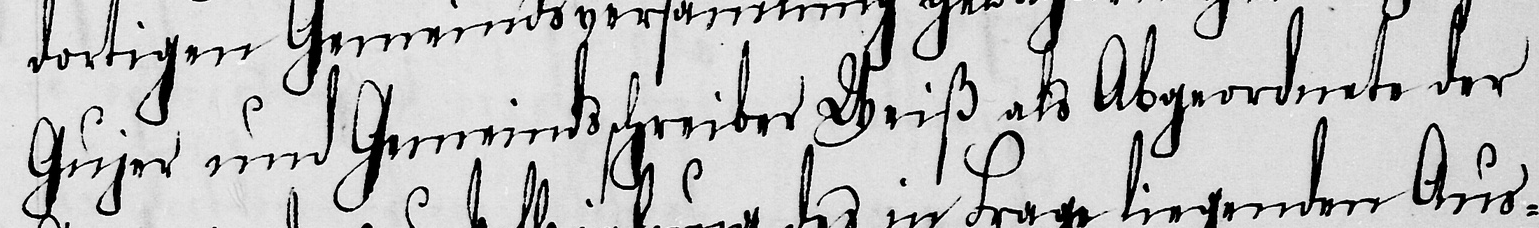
Gujer und Gemeindsschreiber Weiß als Abgeordnete der
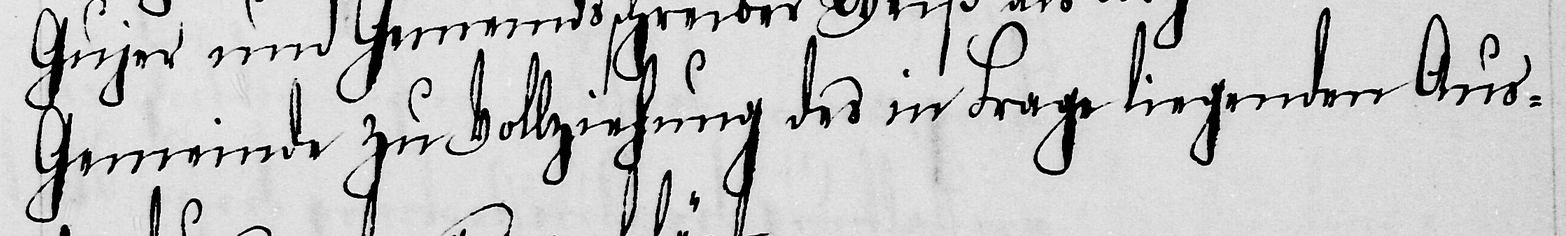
Gemeinde zu Vollziehung des in Frage liegenden Aus¬
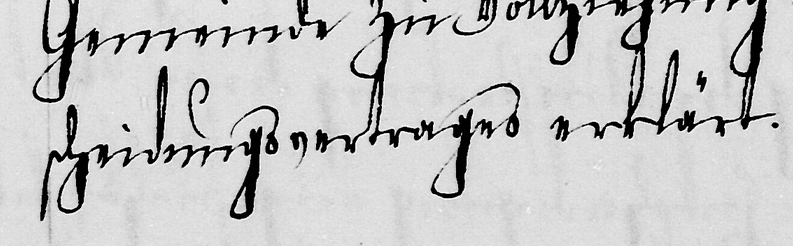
scheidungsvertrages erklärt.
